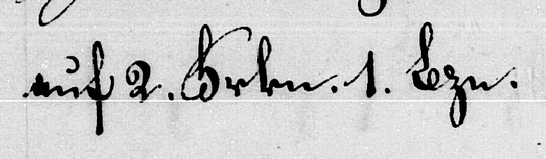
auf 2. Frkn. 1. Bzn.
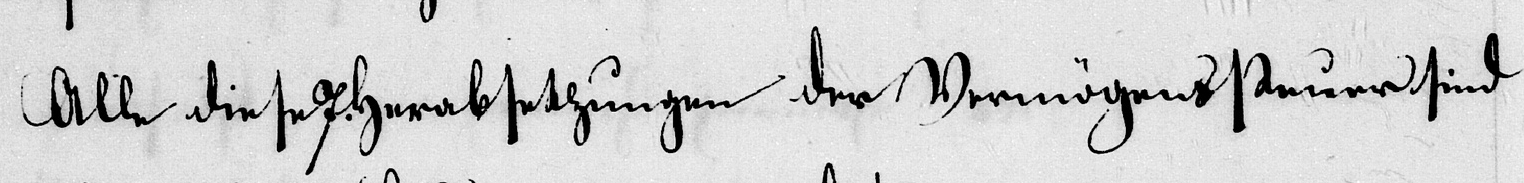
Alle diese 7. Herabsetzungen der Vermögenssteuer sind
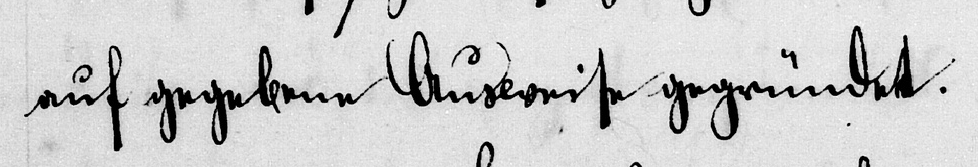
auf gegebenen Ausweise gegründet.
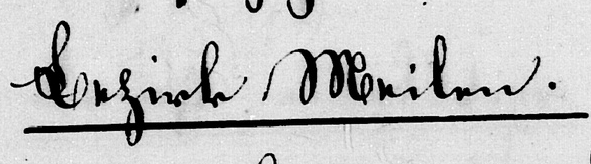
Bezirk Meilen.
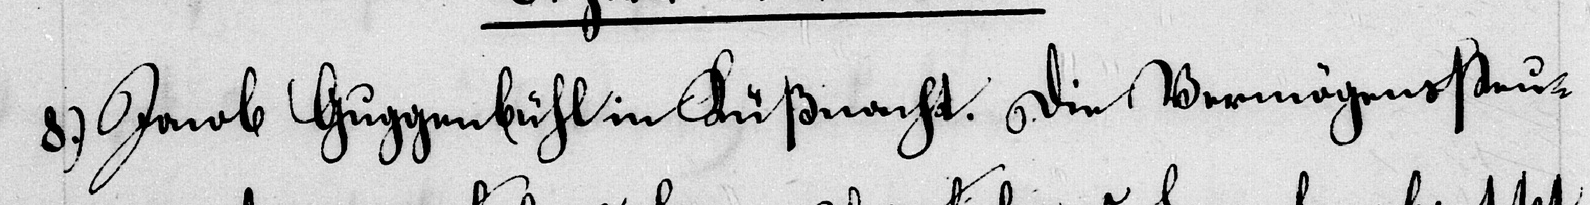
8.) Jacob Guggenbühl in Küßnacht. Die Vermögenssteu¬
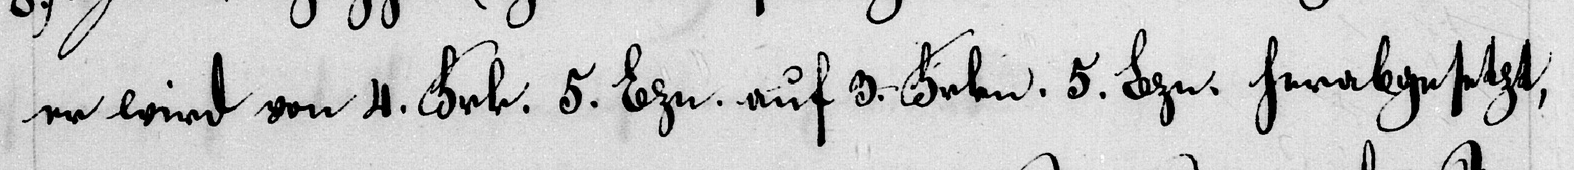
er wird von 4. Frk. 5. Bzn. auf 3. Frkn. 5. Bzn. herabgesetzt,
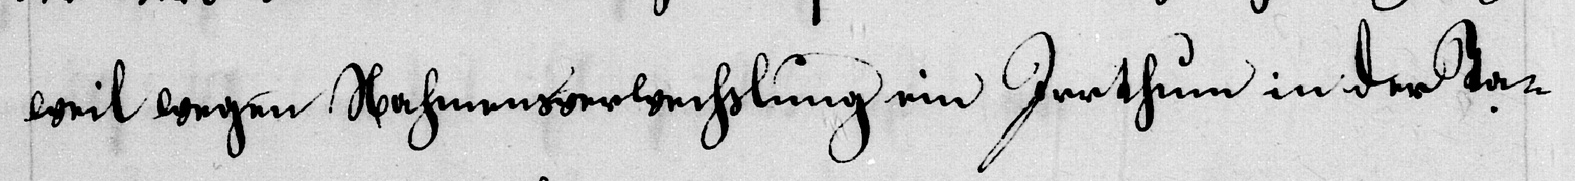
weil wegen Nahmensverwechslung ein Irrthum in der Ta¬
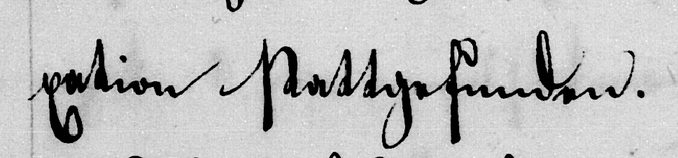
xation stattgefunden.
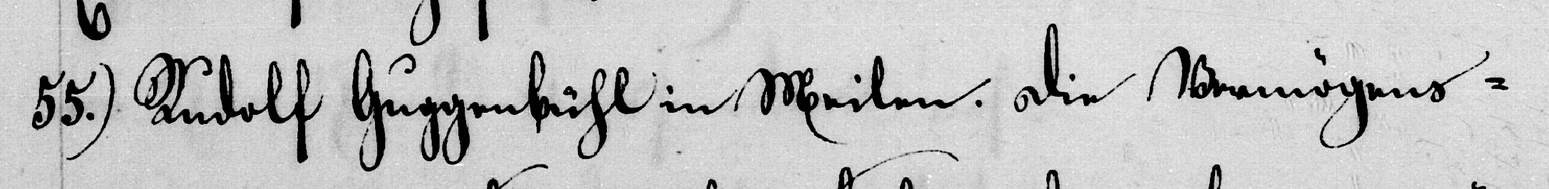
55.) Rudolf Guggenbühl in Meilen. Die Vermögens¬
